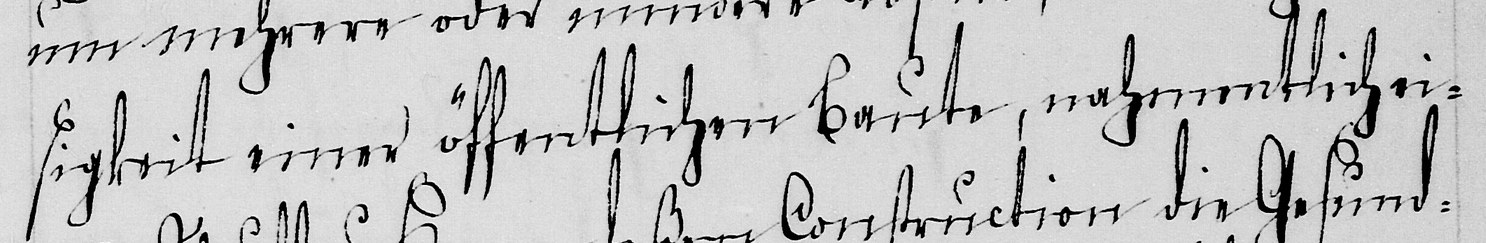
igkeit einer öffentlichen Baute, nahmentlich ei¬
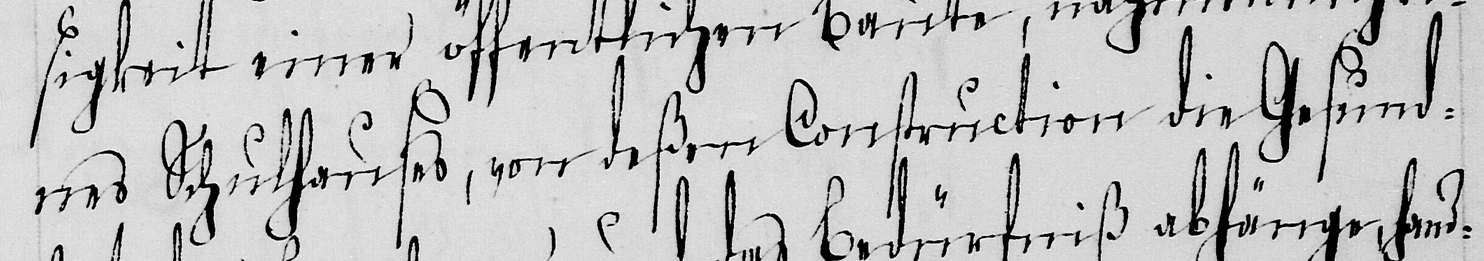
nes Schulhauses, von deßen Construction die Gesund¬
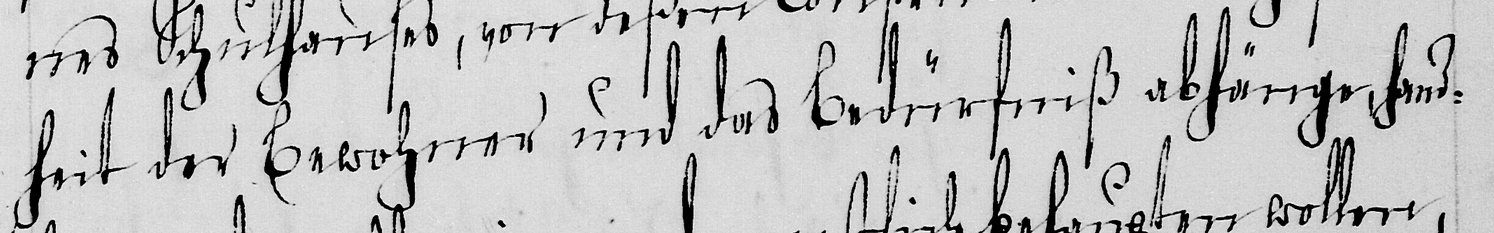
heit der Bewohner und das Bedürfniß abhänge, han¬
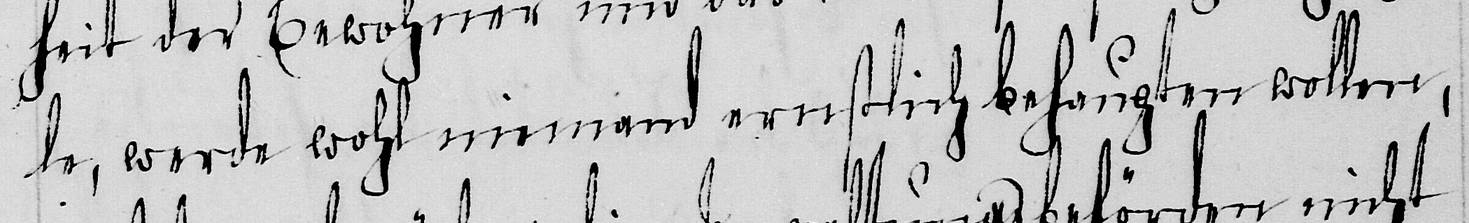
dle, werde wohl niemand ernstlich behaupten wollen,
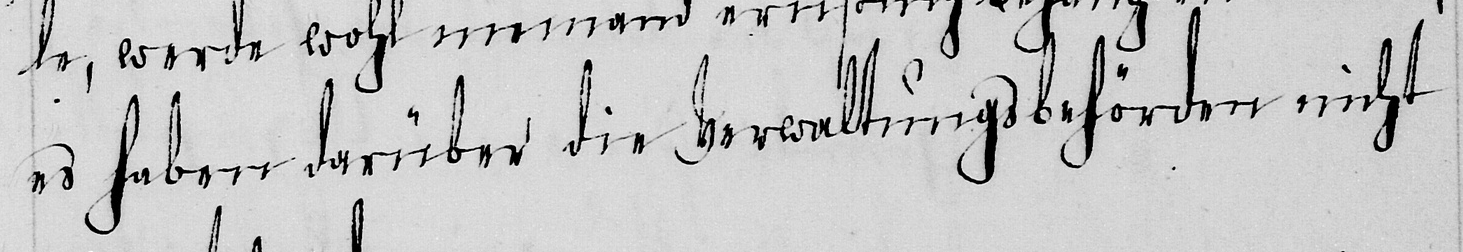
es haben darüber die Verwaltungsbehörden nicht
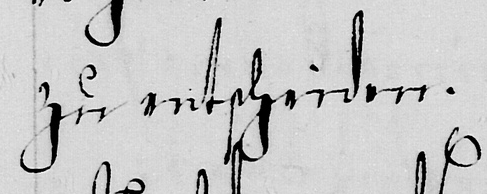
zu entscheiden.
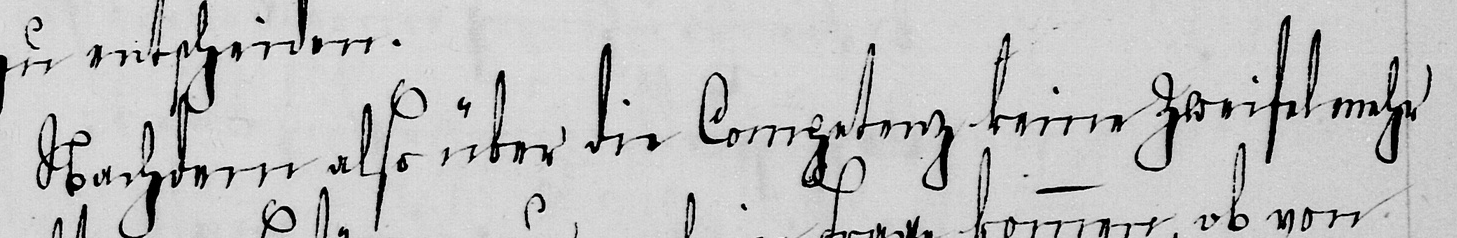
Nachdem also über die Competenz keine Zweifel mehr
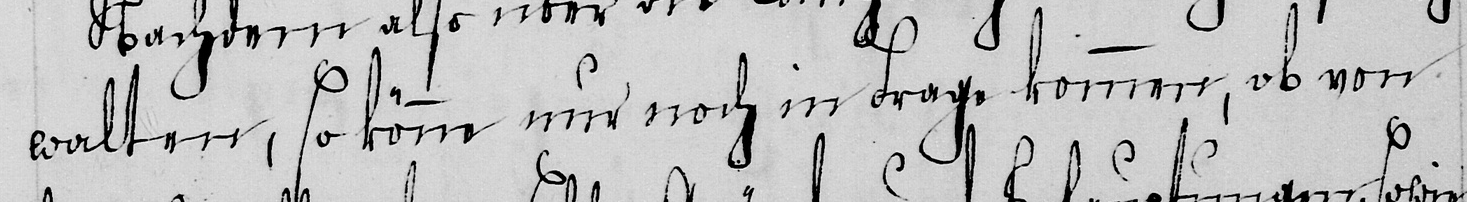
walten, so könne nur noch in Frage kommen, ob von
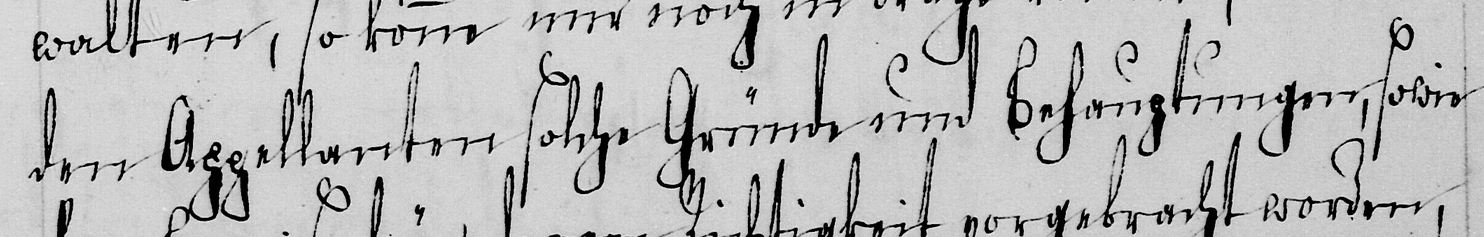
den Appellanten solche Gründe und Behauptungen, sowie
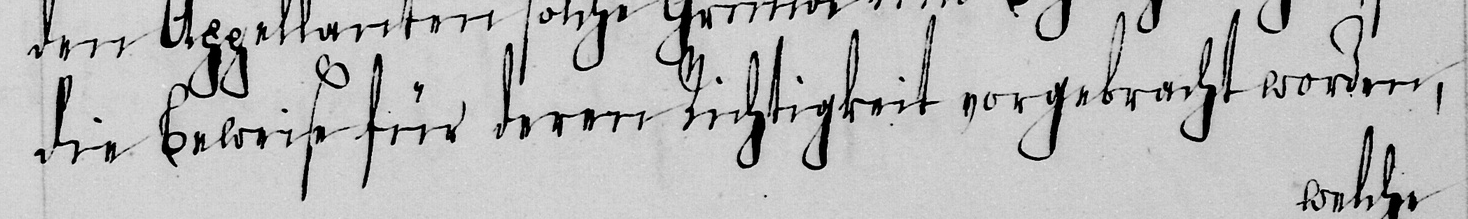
die Beweise für deren Richtigkeit vorgebracht worden,
